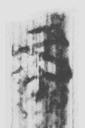不
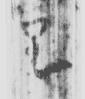巳
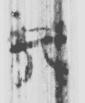亓
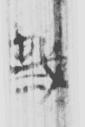{𢦏二}
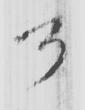乃
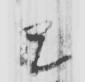巳
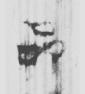厽
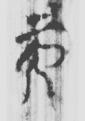而
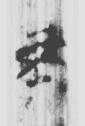不
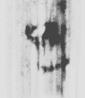巳
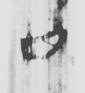四
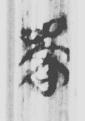{吅吝}
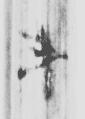之
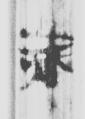者
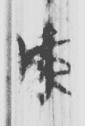侯
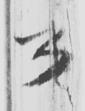乃
